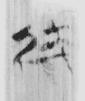隹
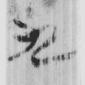九
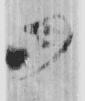月
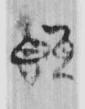既
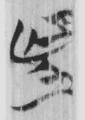望
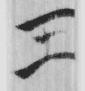壬
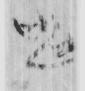申
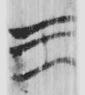王
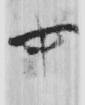才
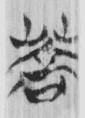蒿
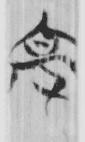京
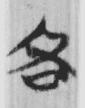各
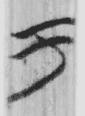于
